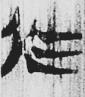於
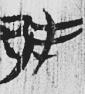邦
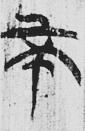不
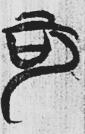可
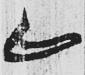㠯
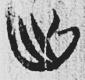出
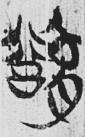豫
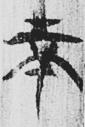不
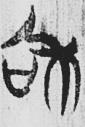和
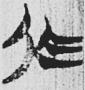於
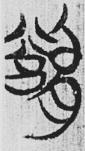豫
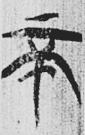不
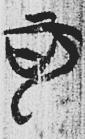可
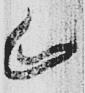㠯
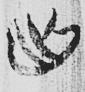出
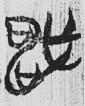○（陳）
